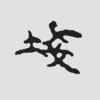{土戔}
